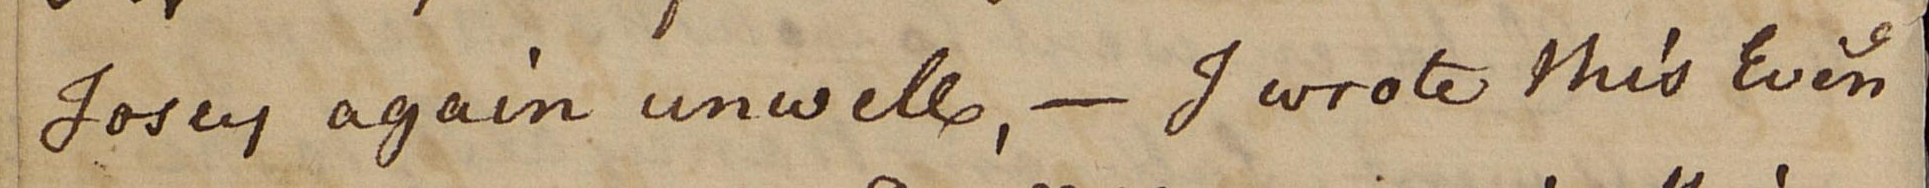Josey again unwell- I wrote this Even^g
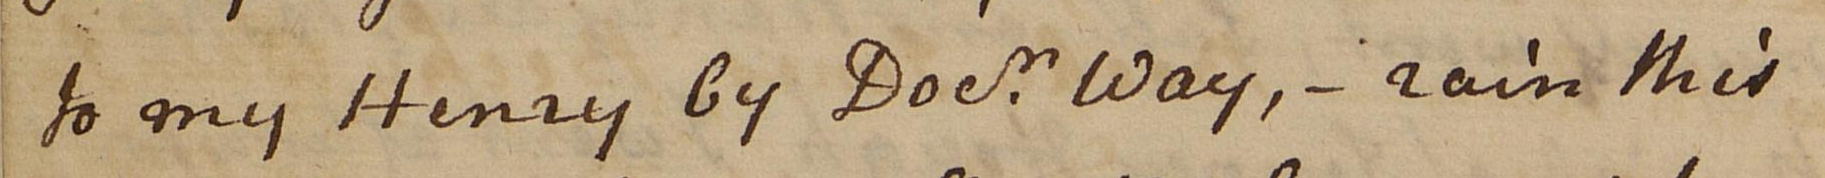to my Henry by Doc^r. Way,- rain this
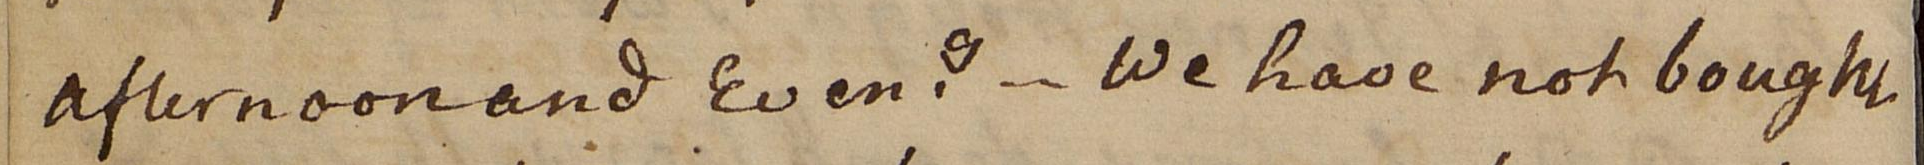Afternoon and Even^g.- We have not bought
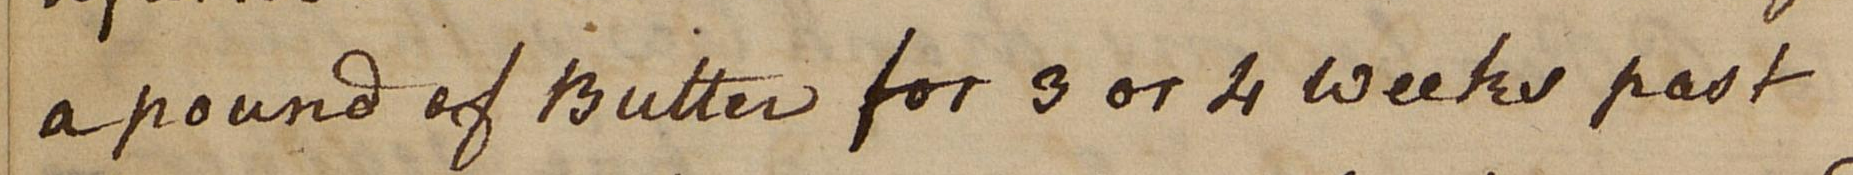a pound of Butter for 3 or 4 weeks past
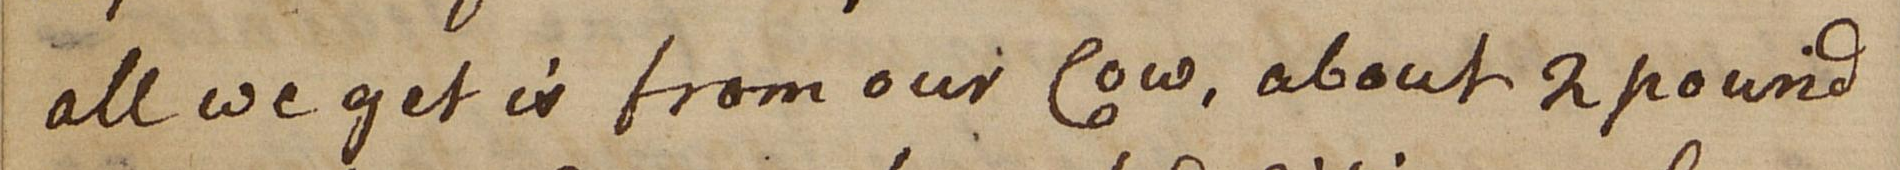all we get is from our Cow, about 2 pound
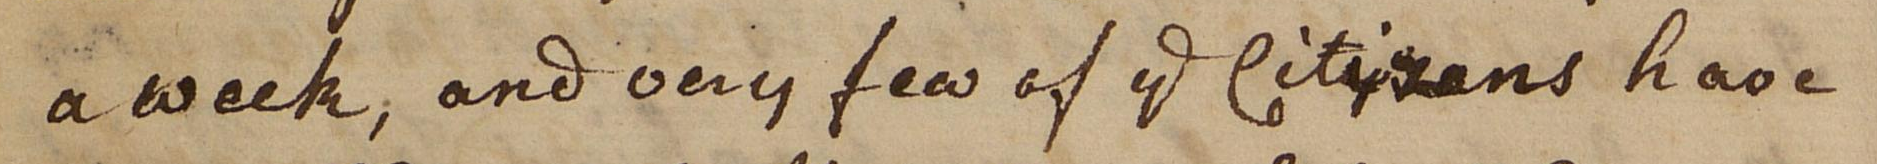a week, and very few of y^e Citizens have
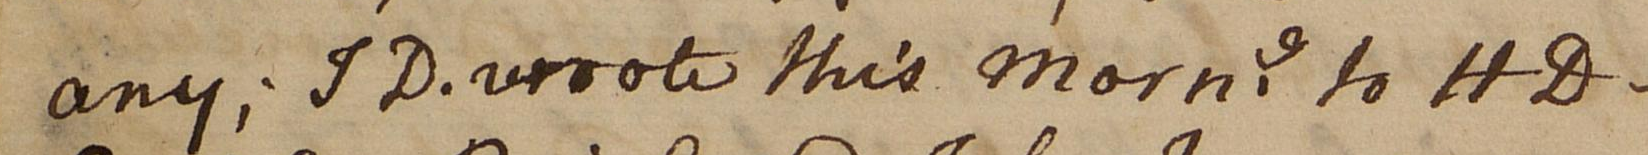any; SD wrote this morn^g. to HD -
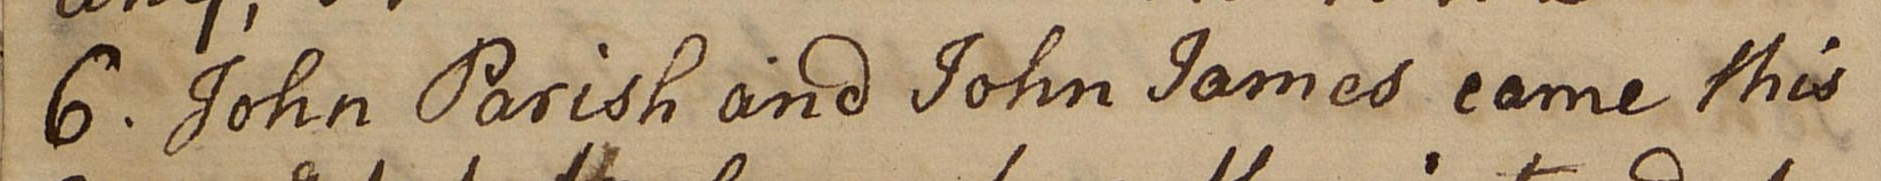6. John Parish and John James came this
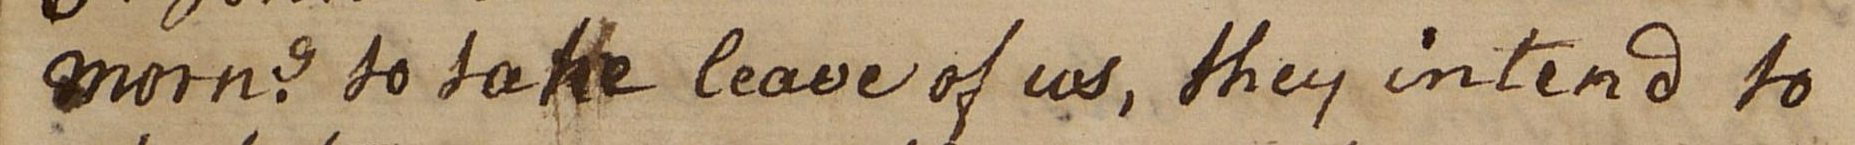morn^g. to take leave of us, they intend to
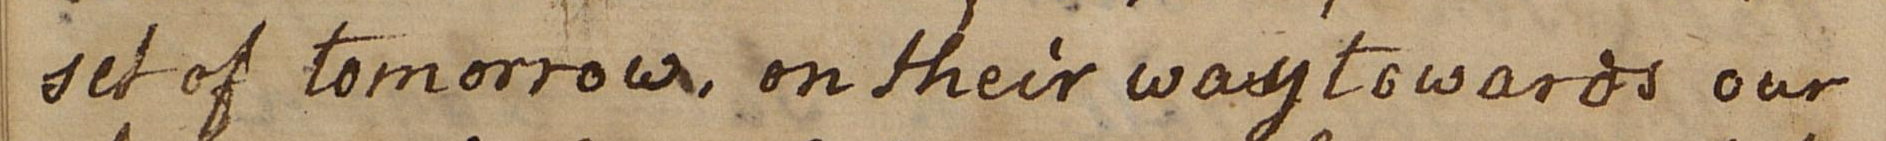set of tomorrow, on their way towards our
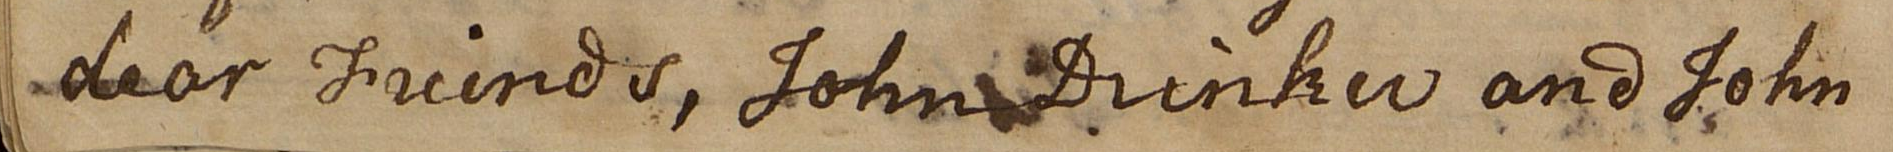dear Friends, John Drinker and John
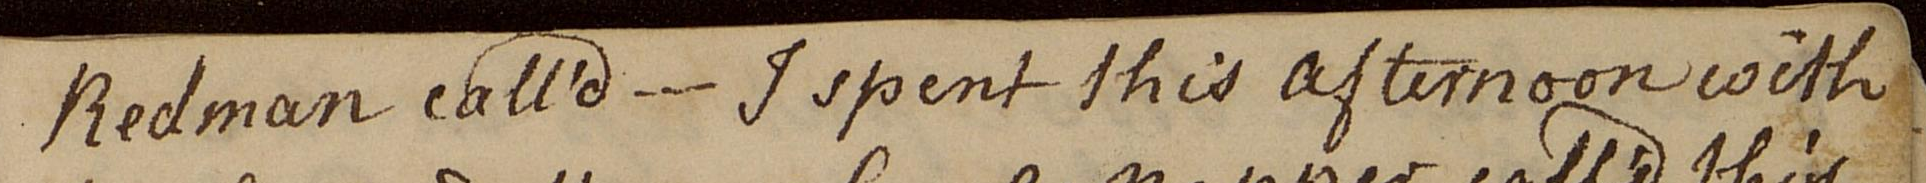Redman call'd- I spent this afternoon with
